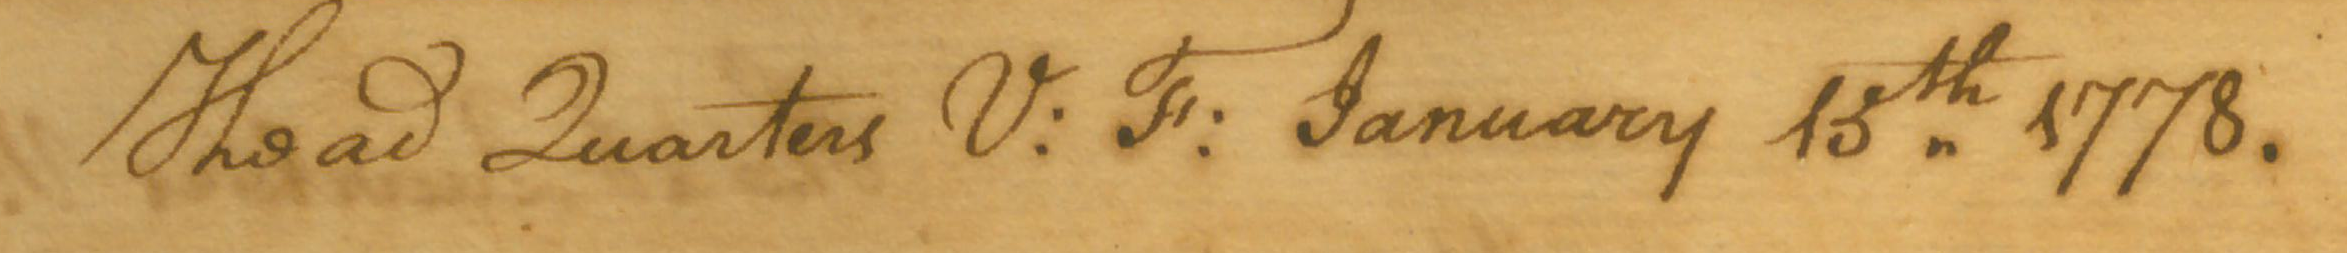Head Quarters V: F: January 15^th. 1778.
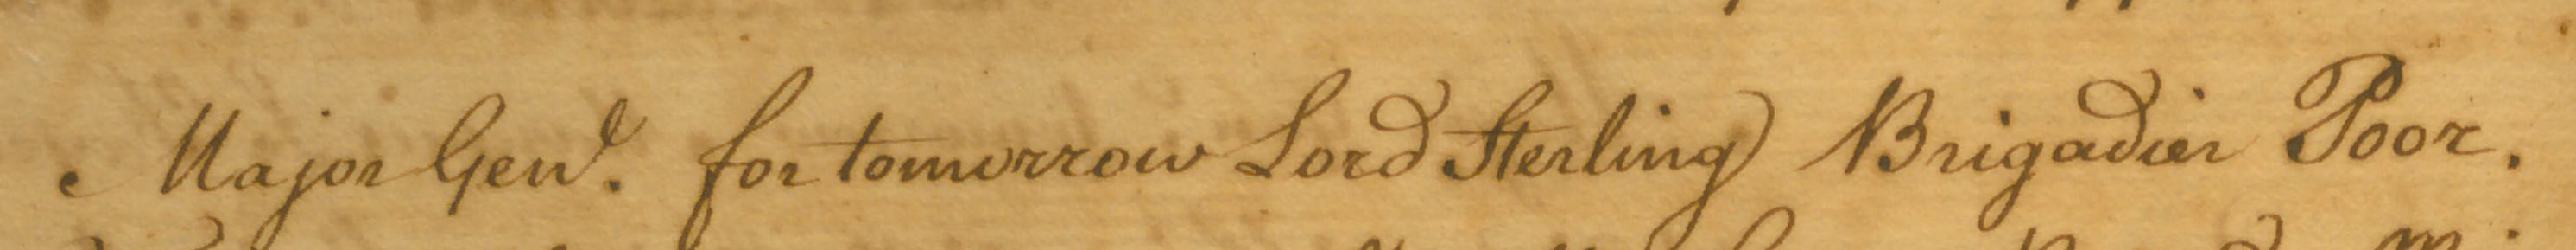Major Gen^l. for tomorrow Lord Sterling Brigadier Poor.
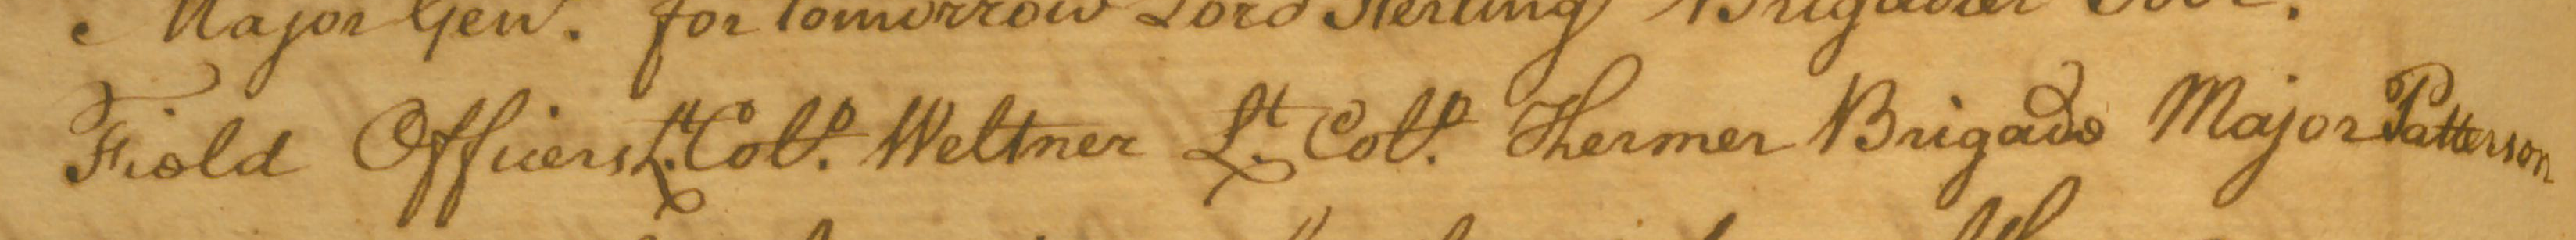Field Officers L^t. Col^o. Weltner L^t. Col^o. Thermer Brigade Major Patterson
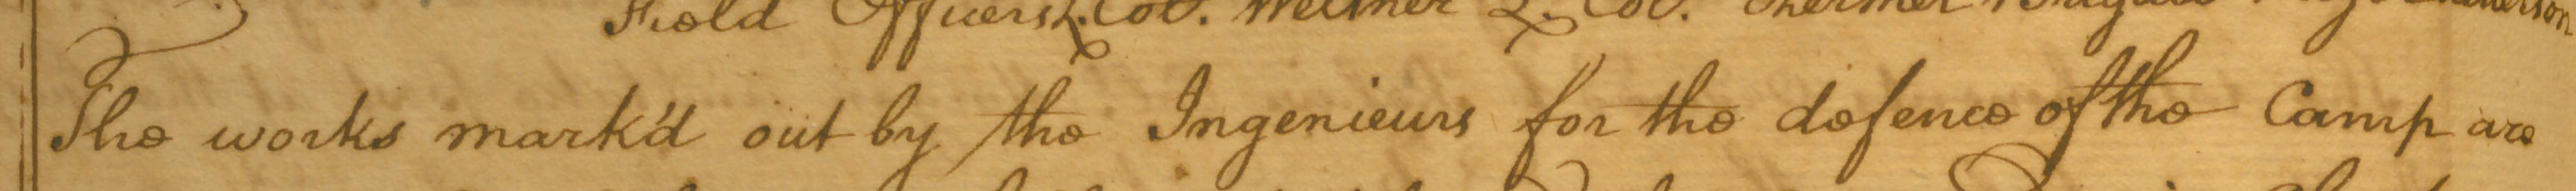The works mark'd out by the Ingenieurs for the defence of the Camp are
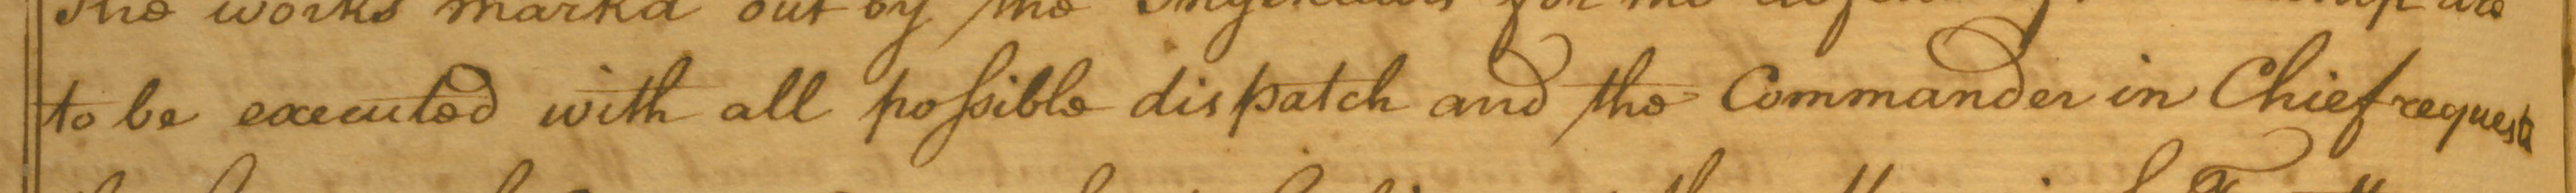to be executed with all possible dispatch and the Commander in Chief requests
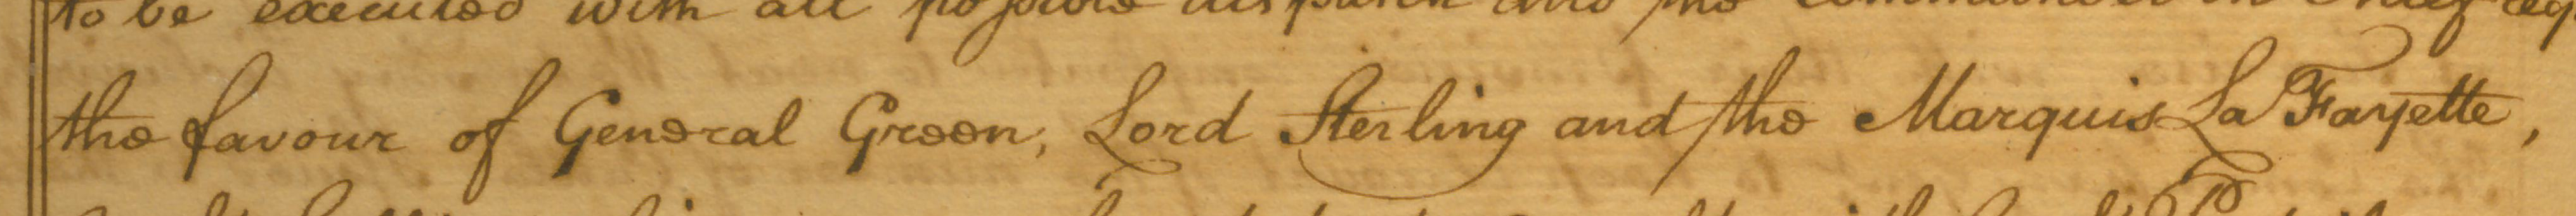the favour of General Green, Lord Sterling and the Marquis La Fayette,
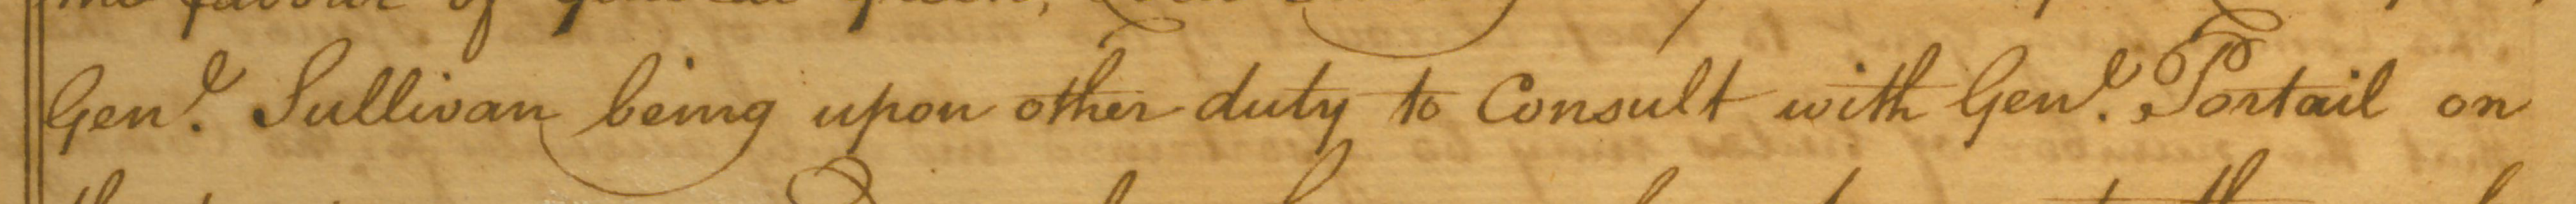Gen^l. Sullivan being upon other duty to Consult with Gen^l. Portail on
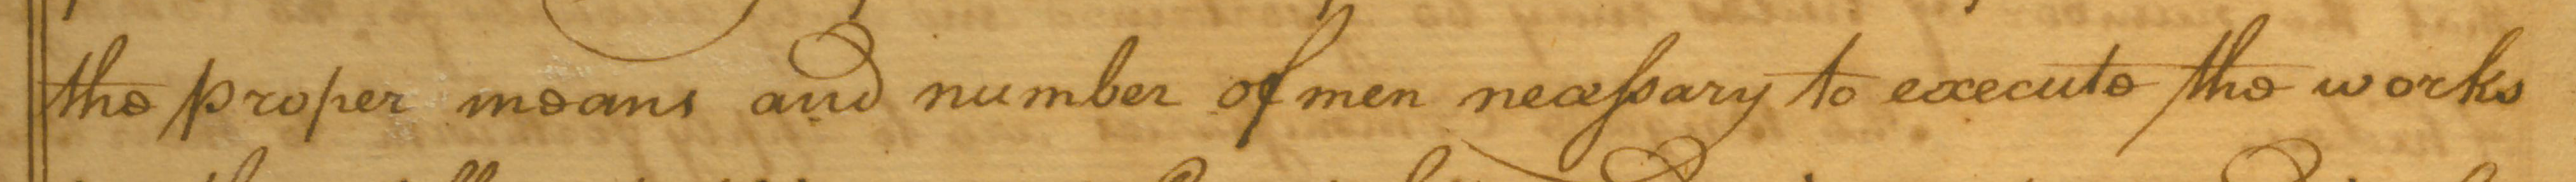the proper means and number of men necessary to execute the works
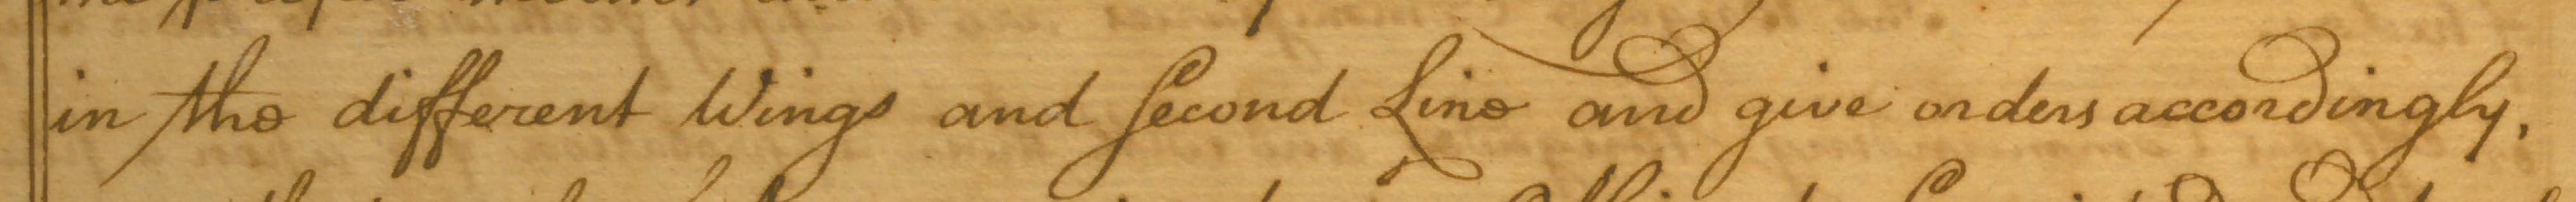in the different Wings and second Line and give orders accordingly,
